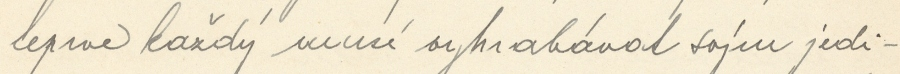teprve každý musí vyhrabávat svým jedi-
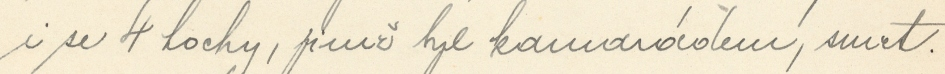i se 4 hochy, jimž byl kamarádem, smrt.
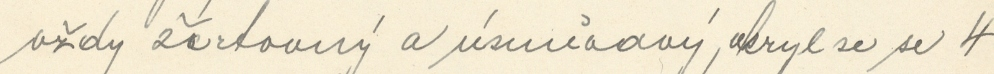vždy žertovný a úsměvavý, ukryl se se 4
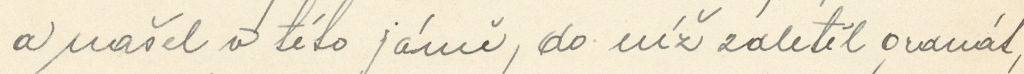a našel v této jámě, do níž zaletěl granát,
